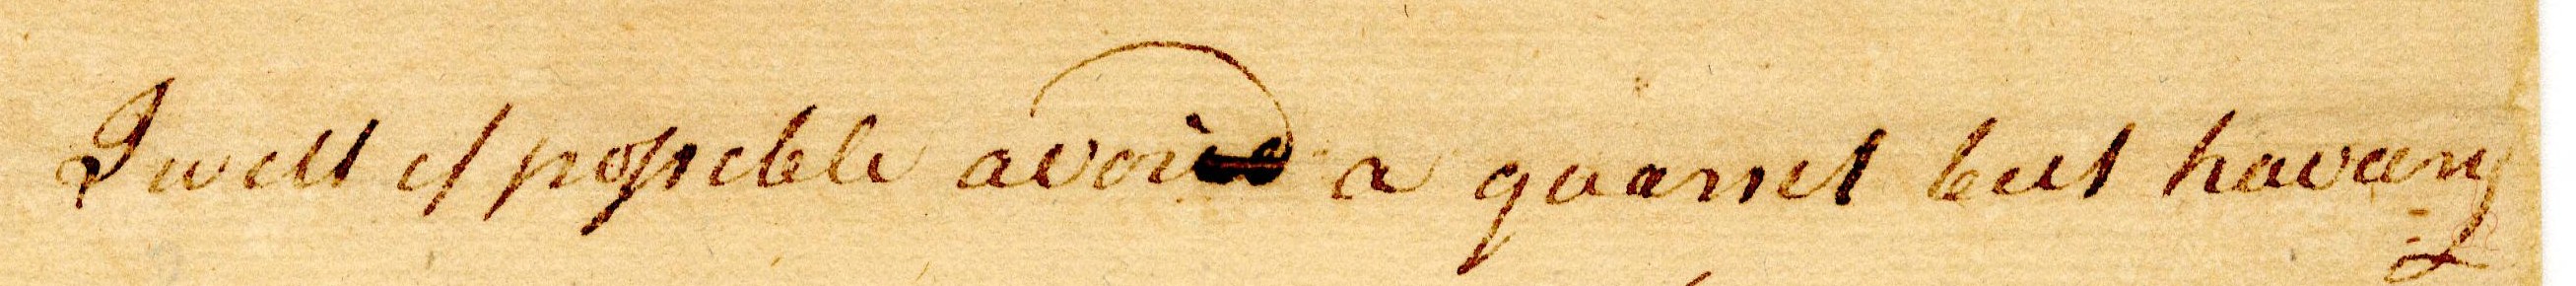I will if possible avoid a quarrel but haveing
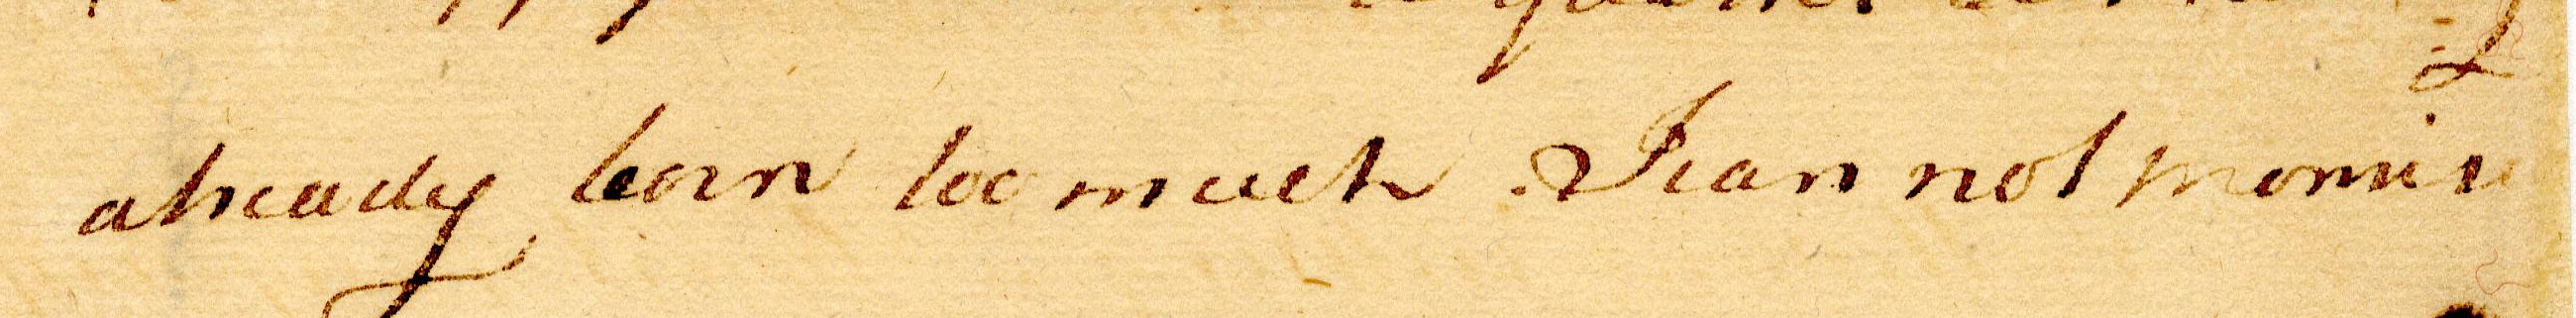already born too much. I can not promise
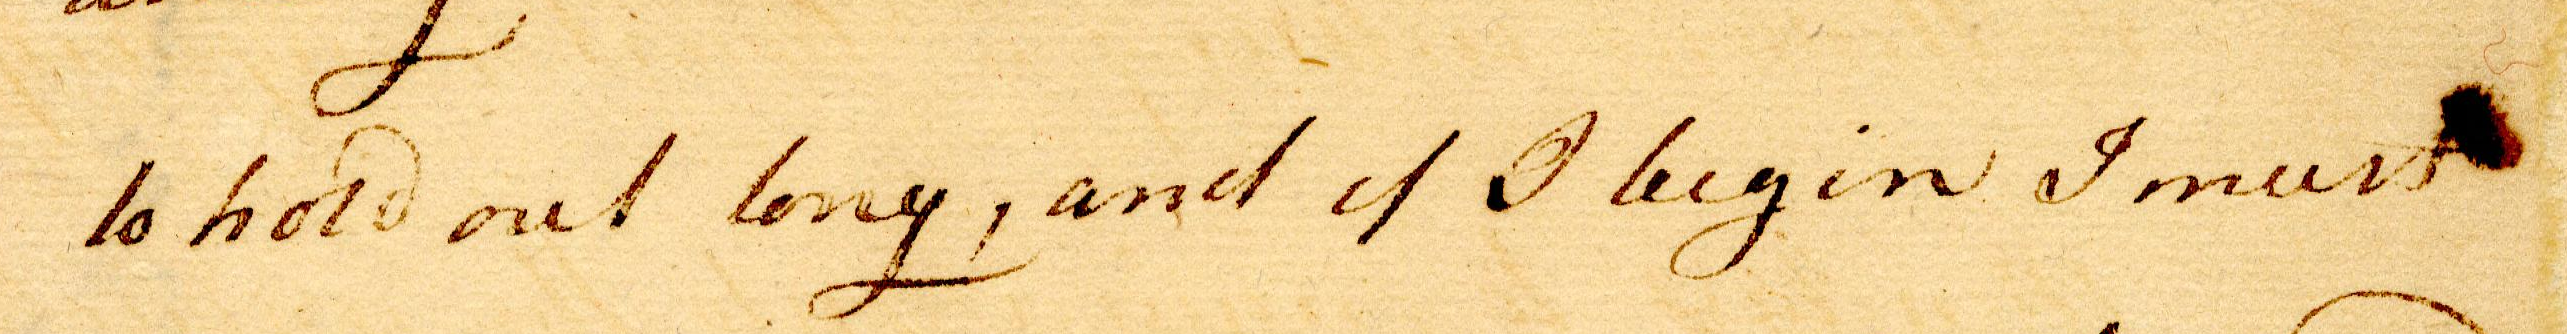to hold out long, and if I begin I must
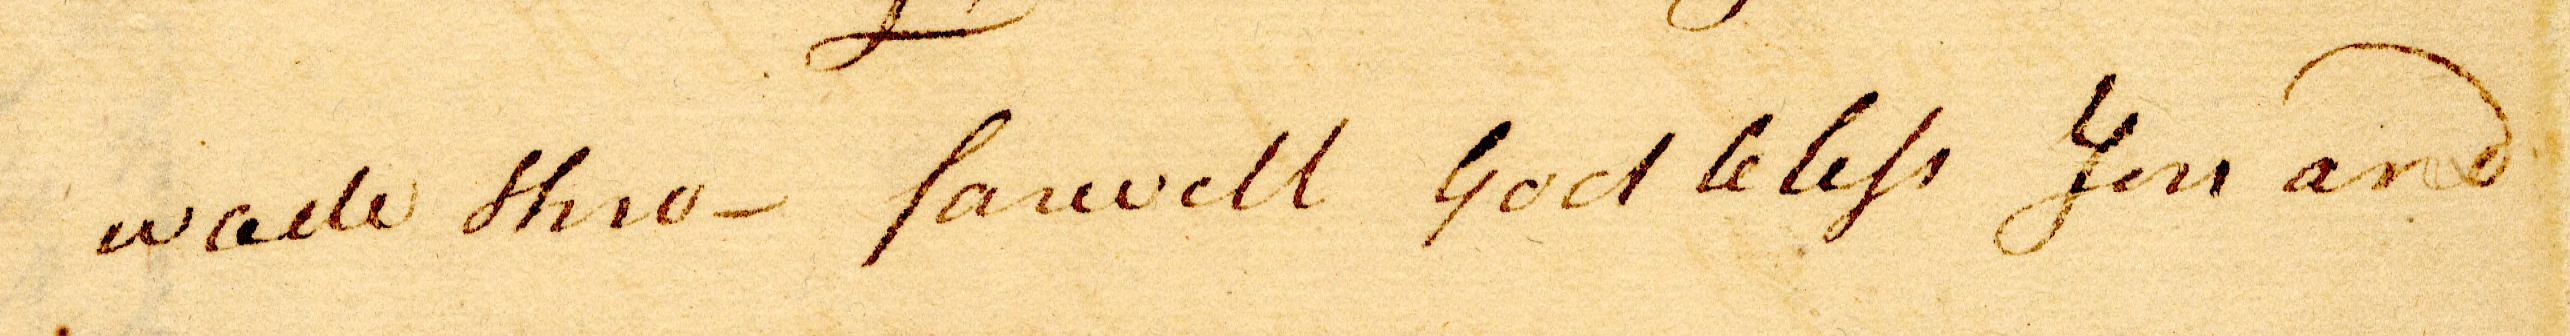wade thro- farwell God bless You and
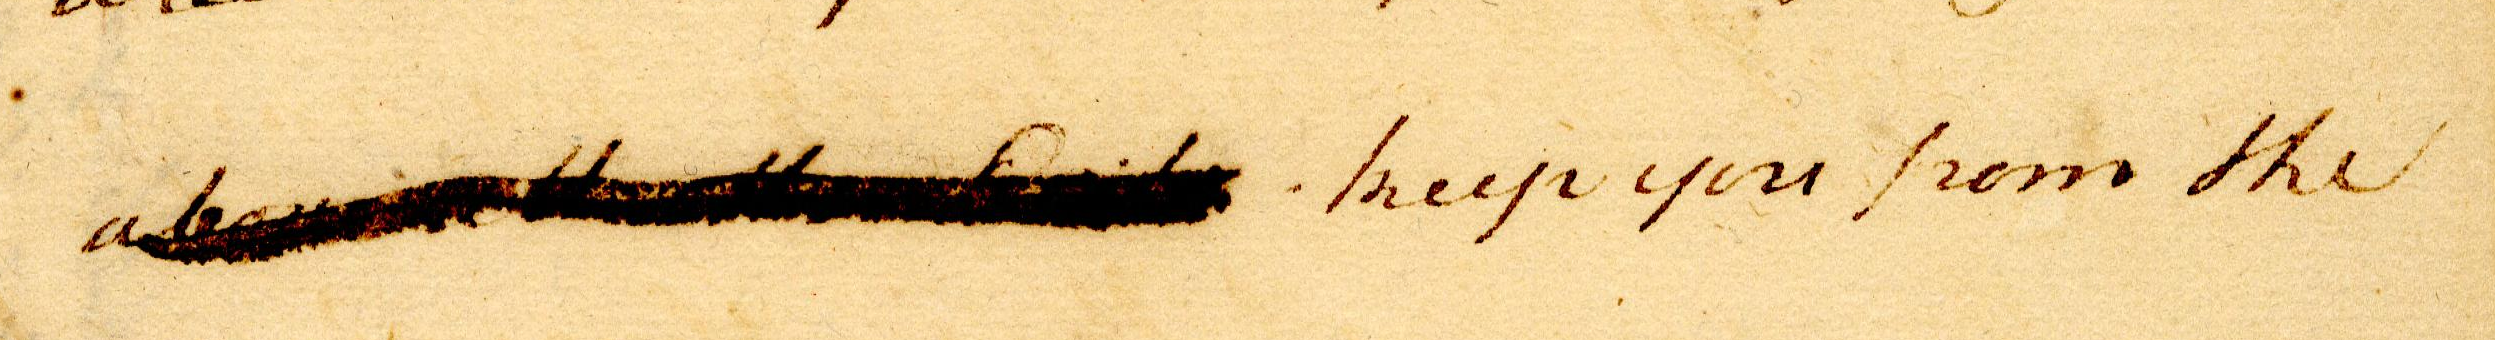[____________] keep you from the
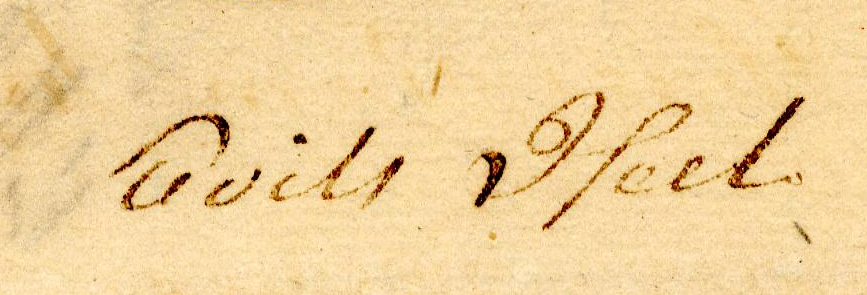Evils I feel
